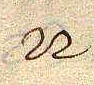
22
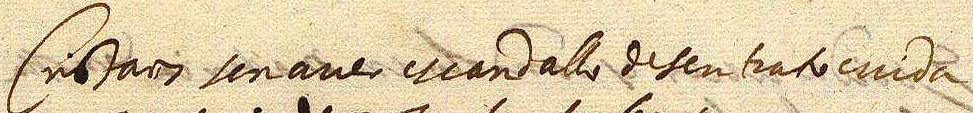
Cristaos sen auer escandallo de seu trato cuida
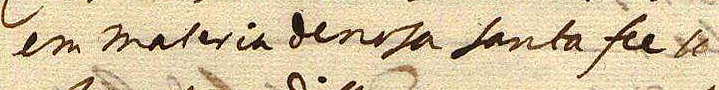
em materia de nosa santa fee //
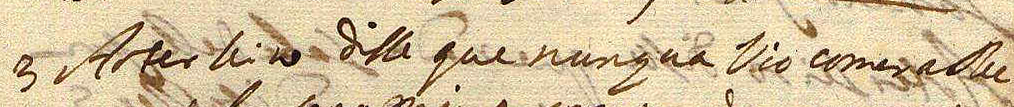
3 Ao terseiro disse que nunqua vio comer a Ree
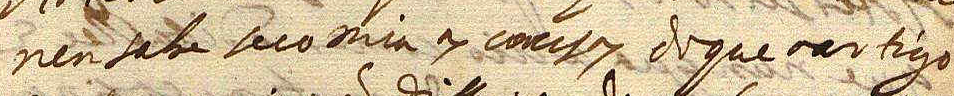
nem sabe se comia as cousas do que o artigo
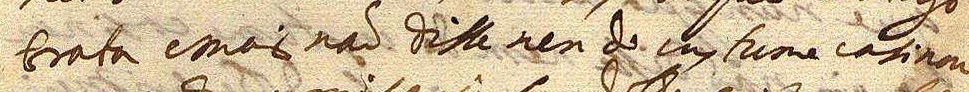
trata e mais naõ disse nen do custume e asinou
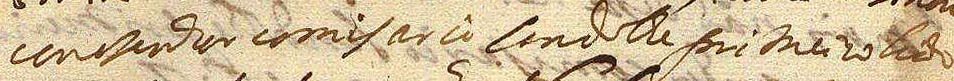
com o senhor comisario sendolhe primeiro lido
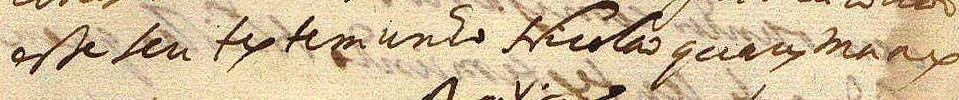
este seu testemunho Nicolao quaresma o es
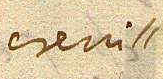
creui //
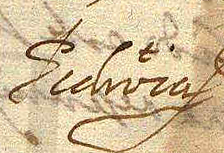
Pedroza
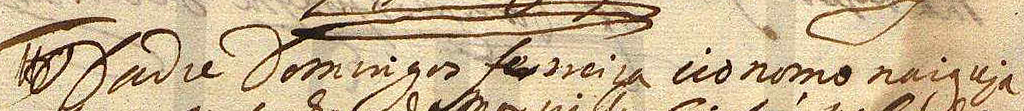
item Padre Domingos ferreira iconomo na igreja
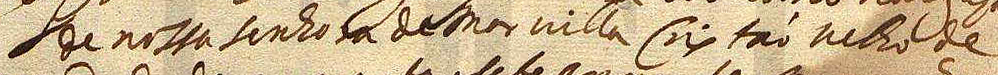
de nossa senhora de maruilla Cristaõ uelho de
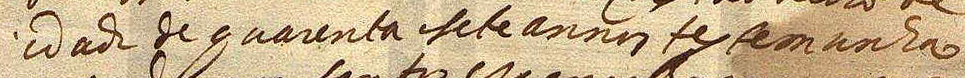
idade de quarenta e sete annos testemunha
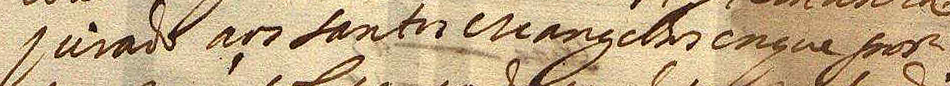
jurado aos santos euangelhos en que pos
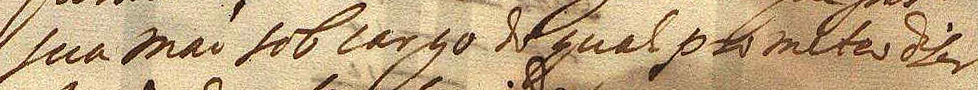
sua maõ sob cargo do qual prometeo diser
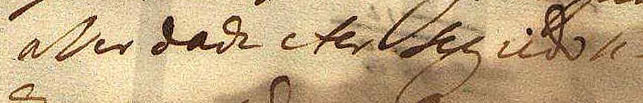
a verdade e ter segredo //
